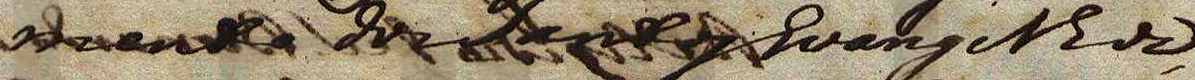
mento dos santos Evangelhos,
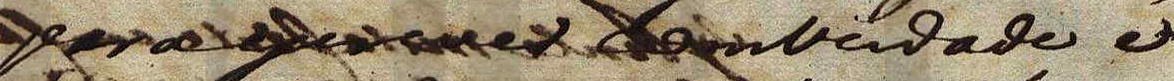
para escrever com verdade e
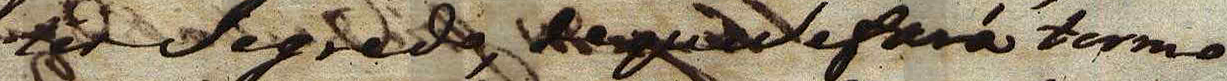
ter Segredo, de que se fará termo
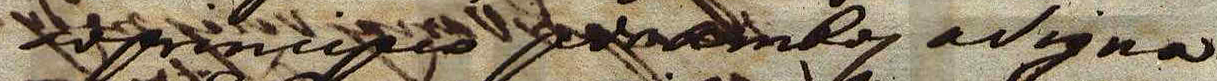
ao principio por ambos asigna
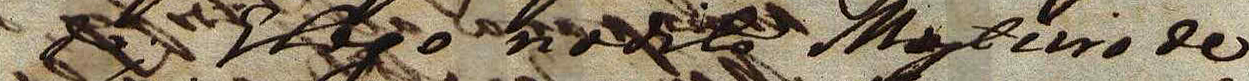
do; E Logo no dito Mosteiro de
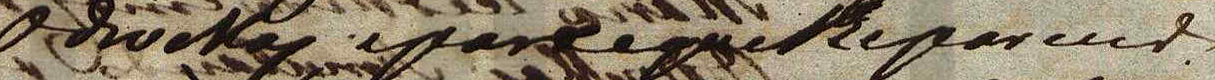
Odivellas, e parte que lhe parecer
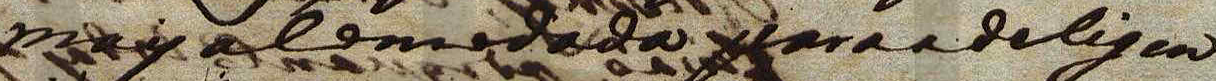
mais acomodada para a deligen
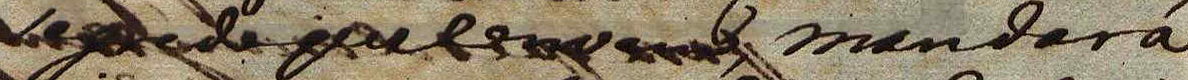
segredo que convem, mandará
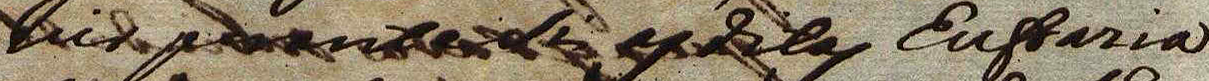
vir perante si as ditas Eufrazia
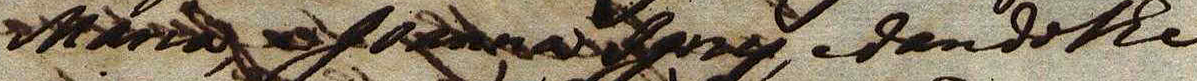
Maria, e Joanna Ignes, e dandolhe
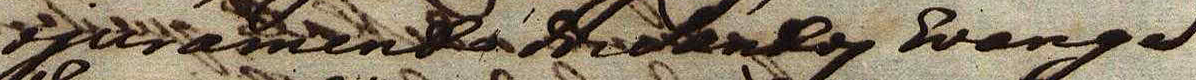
o juramento dos santos Evange
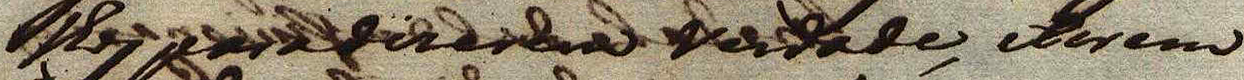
lhos para dizerem verdade, e terem
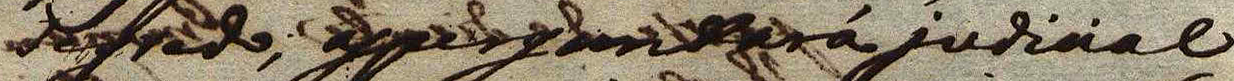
segredo, as perguntará judicial
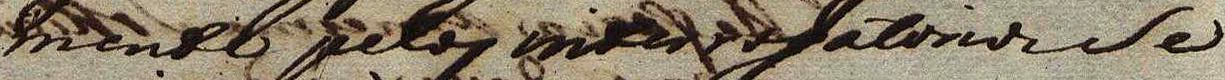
mente pelos interrogatorios Se
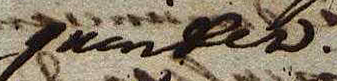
guintes.
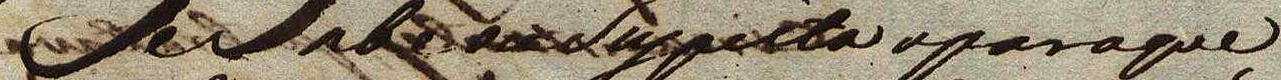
Se Sabe ou Suspeita o para que
